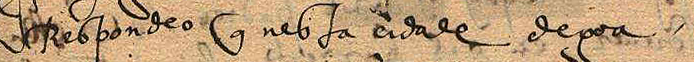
Respondeo q̄ nesta çidade de goa /
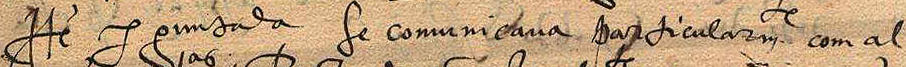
Jtē ꝑguntada se comunicaua particularmte com al
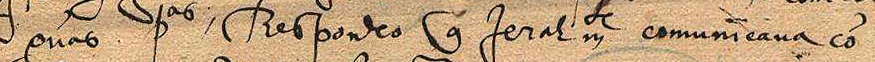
gūas pas / Respondeo q̄ Jeralmte comunicaua cō
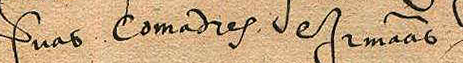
Suas Comadres e Jrmāas /
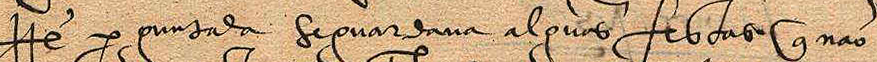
Jtem ꝑguntada se guardaua alguās festas q̄ naõ
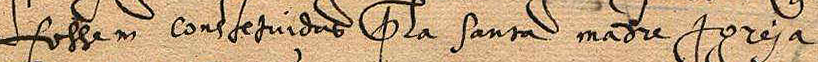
fossem constetuidas p̄la santa madre Jgreja
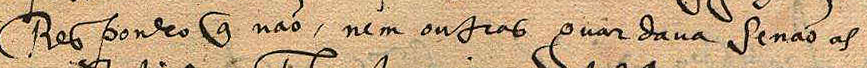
Respondeo q̄ não / nem outras guardaua senão as
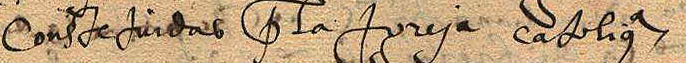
Constetuidas p̄la Jgreja catoliqa /
